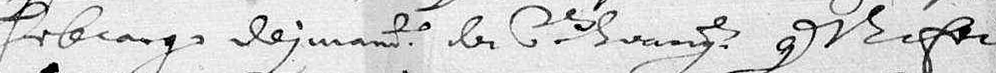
sob cargo do juram.to dos Pes Evang.os q̄ lhe foi
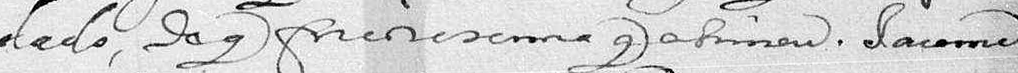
dado, do q̄ fis este termo q̄ asinou. Iacome
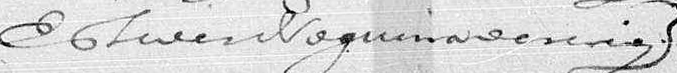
Esteves Nogueira o escreuj.
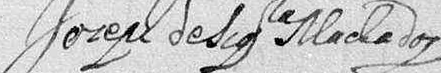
Jozeph de Seqra Machado
